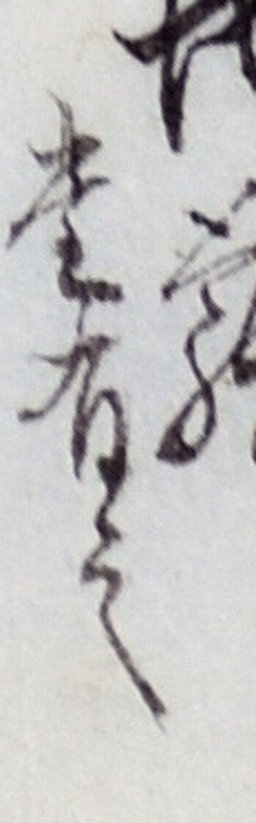堂有之
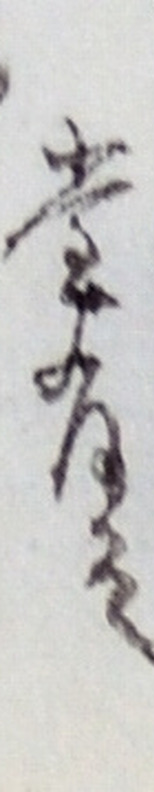堂有之
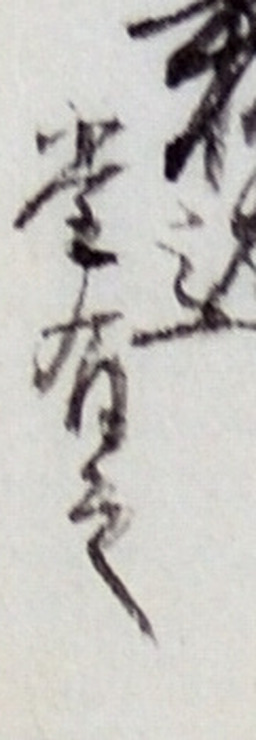堂有之
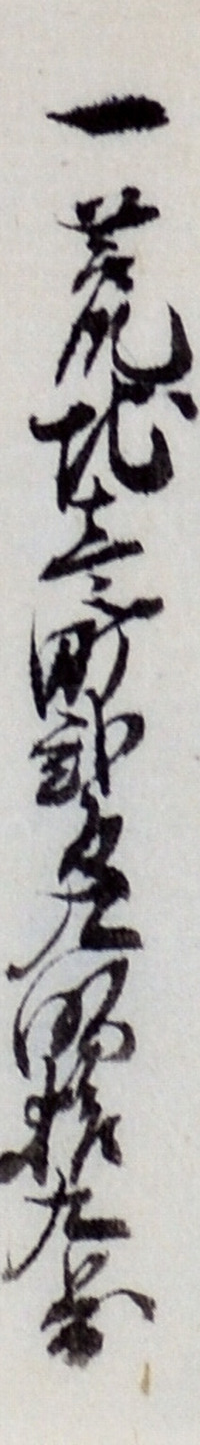一荒地壱町弐反九畝拾九歩村中
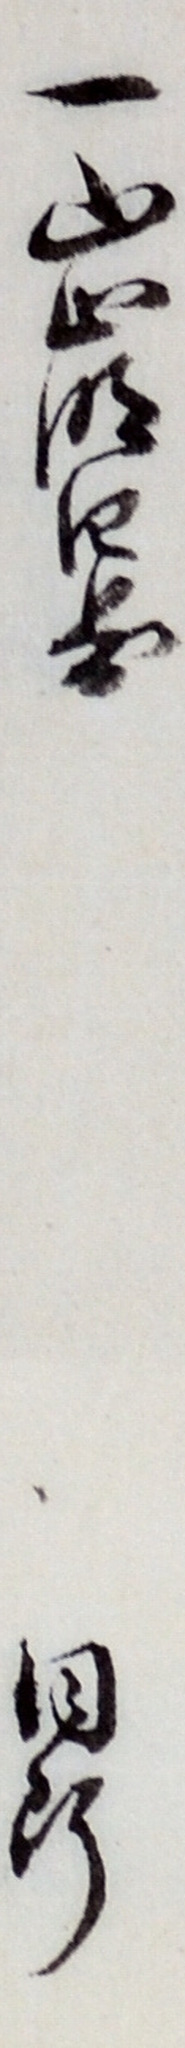一山崩四歩同断
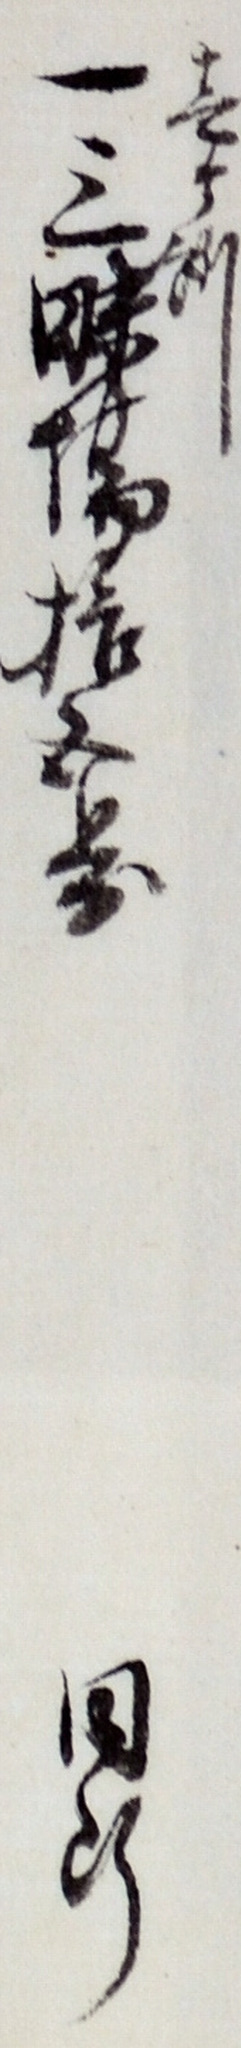一三昧場拾五歩同断
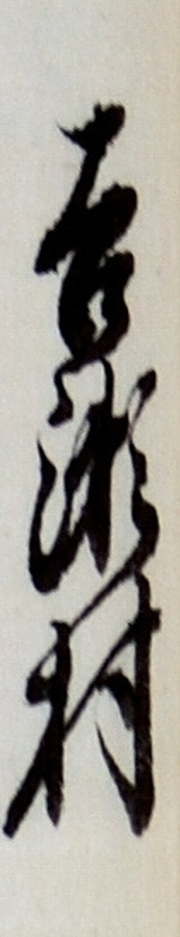吉瀬村
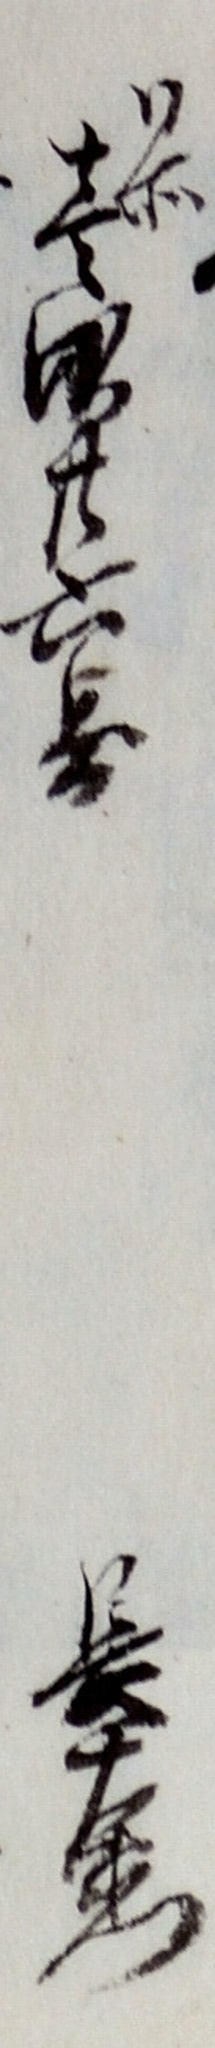壱畝廿六歩長右衛門
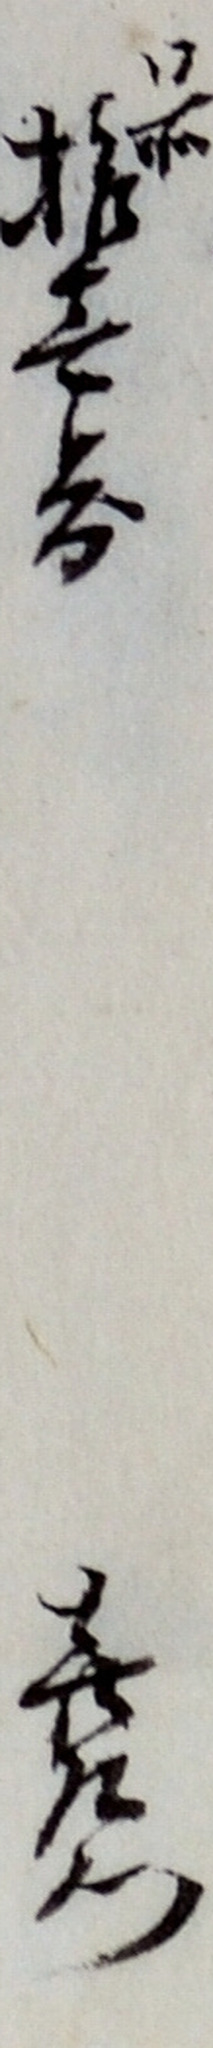拾壱歩喜左衛門
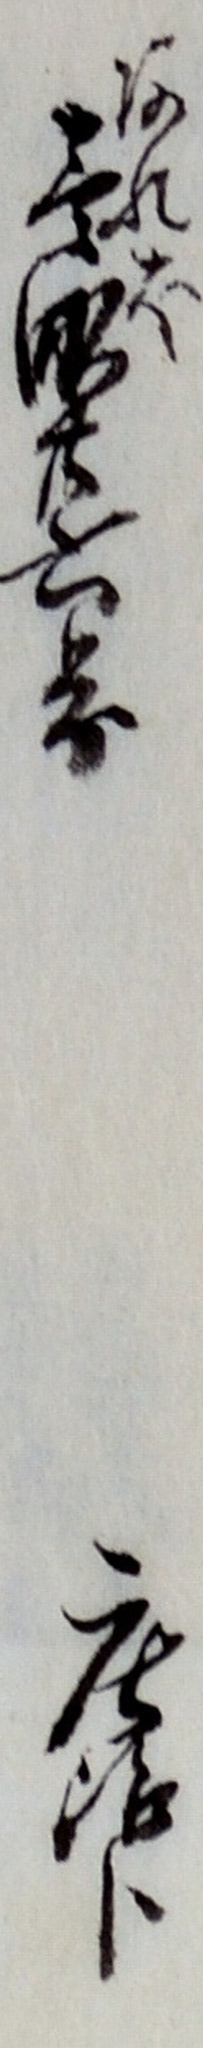壱畝廿六歩庄治郎
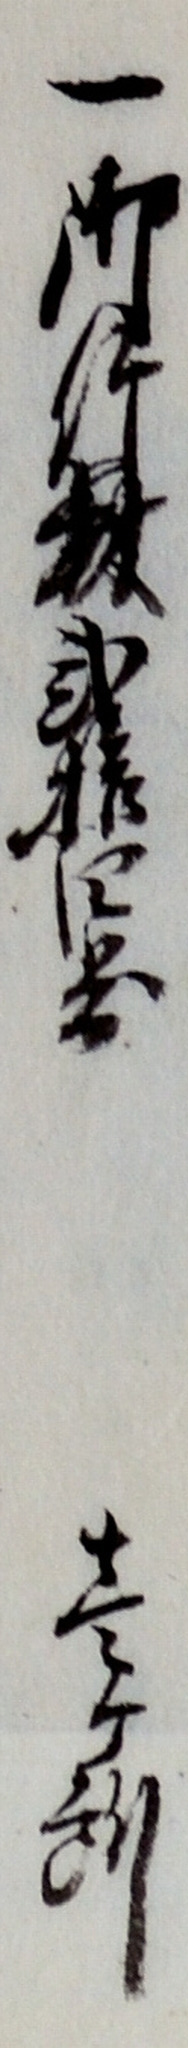一御竹藪弐拾四歩壱ヶ所
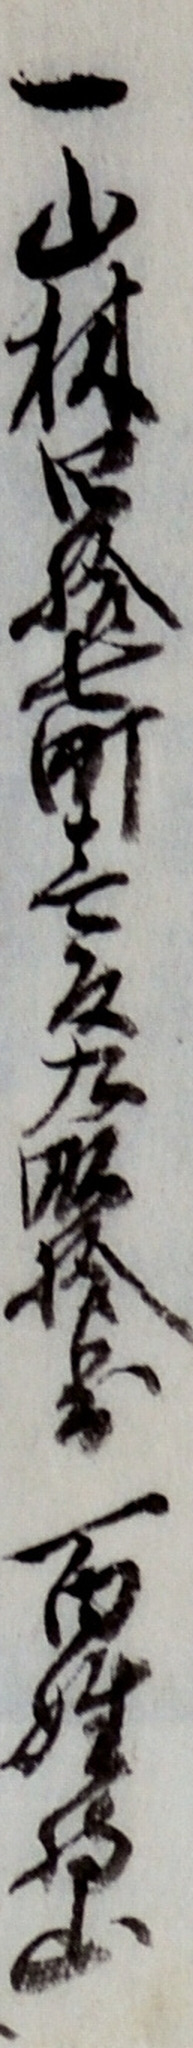一山林四拾七町壱反九畝拾歩百姓持山
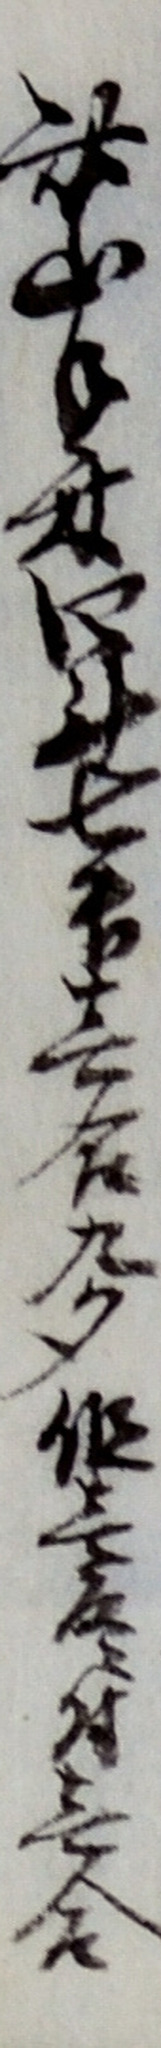此山手米四斗七升壱合九勺但壱反ニ付壱合

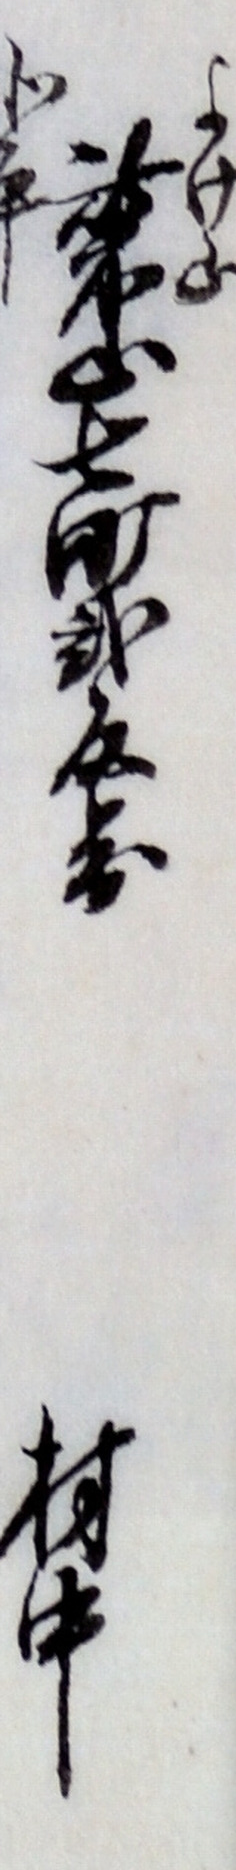柴山七町弐反歩村中
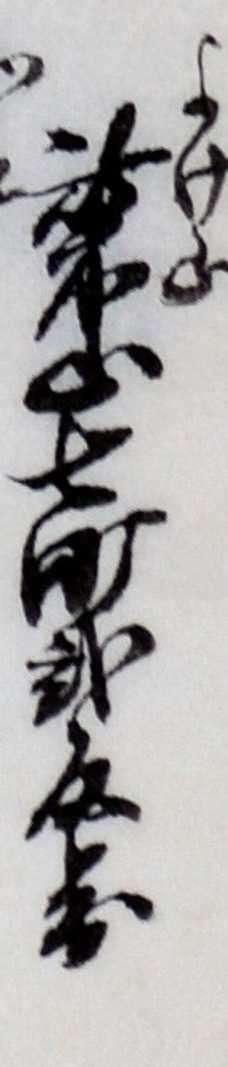柴山七町弐反歩村中
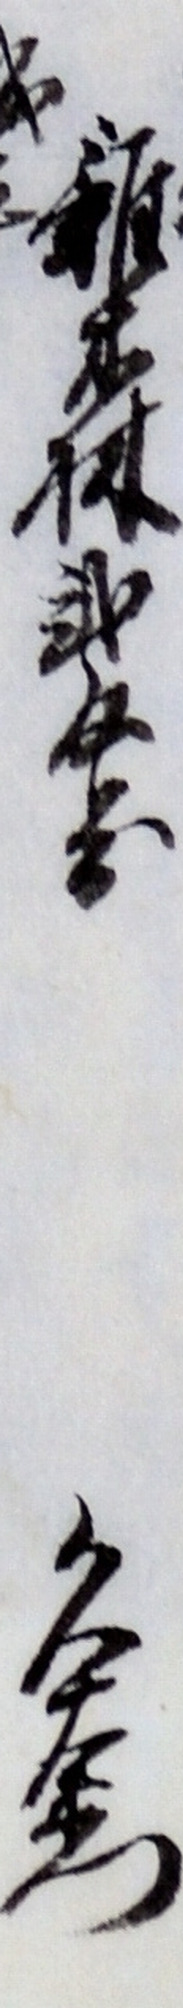雑木林弐反歩久右衛門
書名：御領分中山林社地手控
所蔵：伊那市立高遠町図書館・合同会社AMANE
